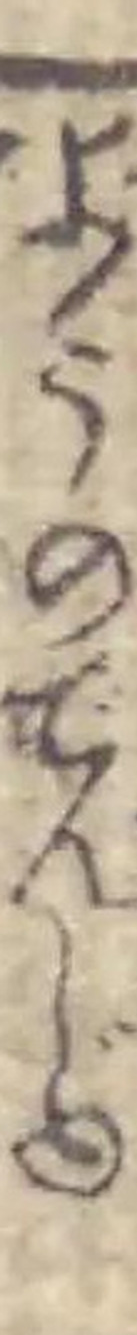ようのでんじゆ
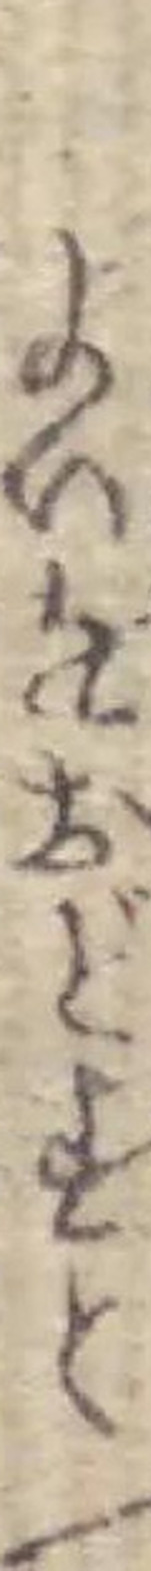よいをおどすと
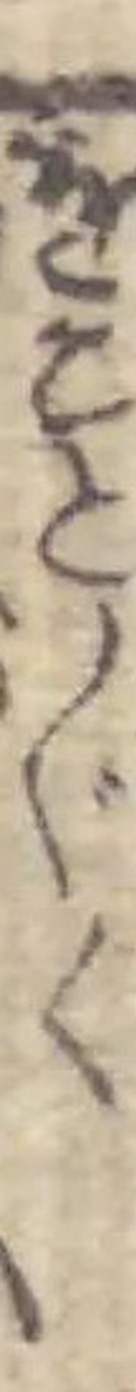をこと〴〵く
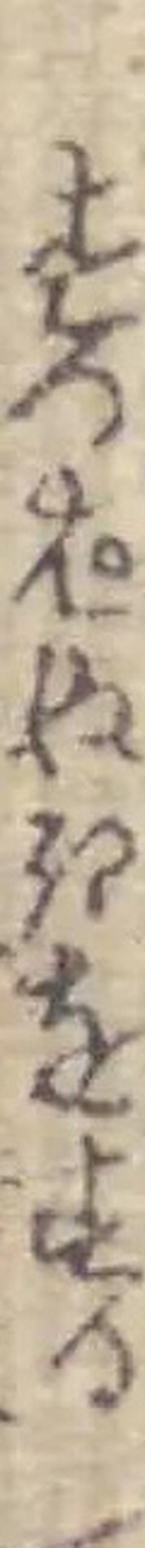すつぱぬきをする
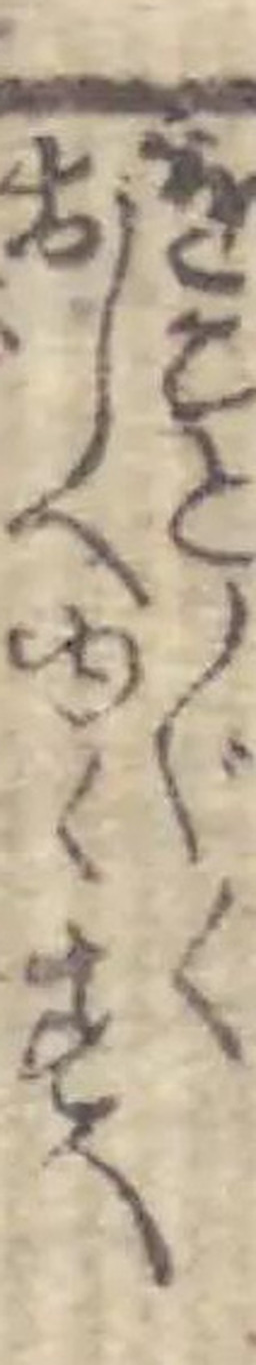おしへゆくすへ
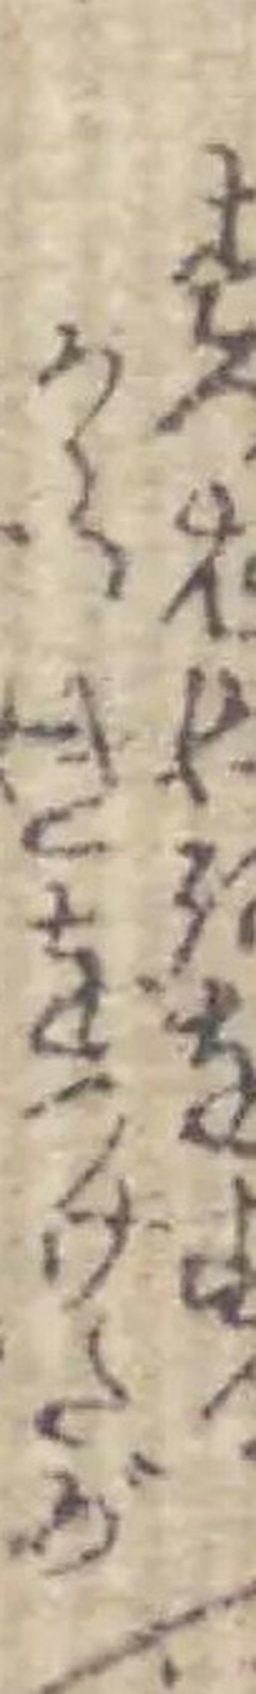からきをつけたが
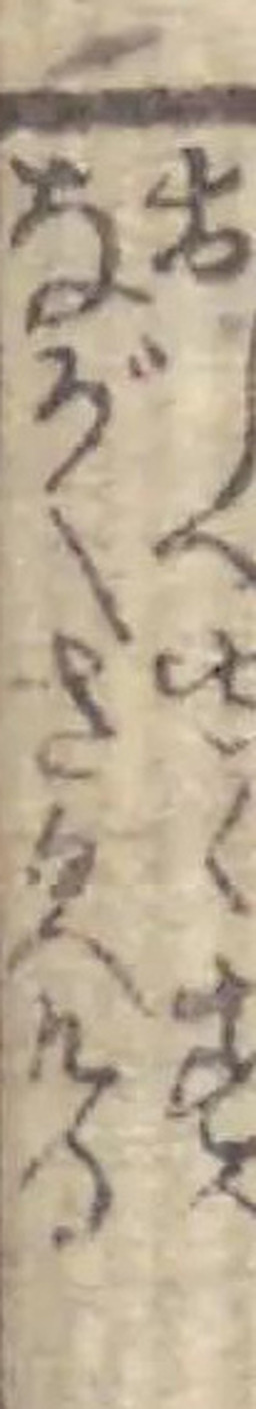ながくさかへける
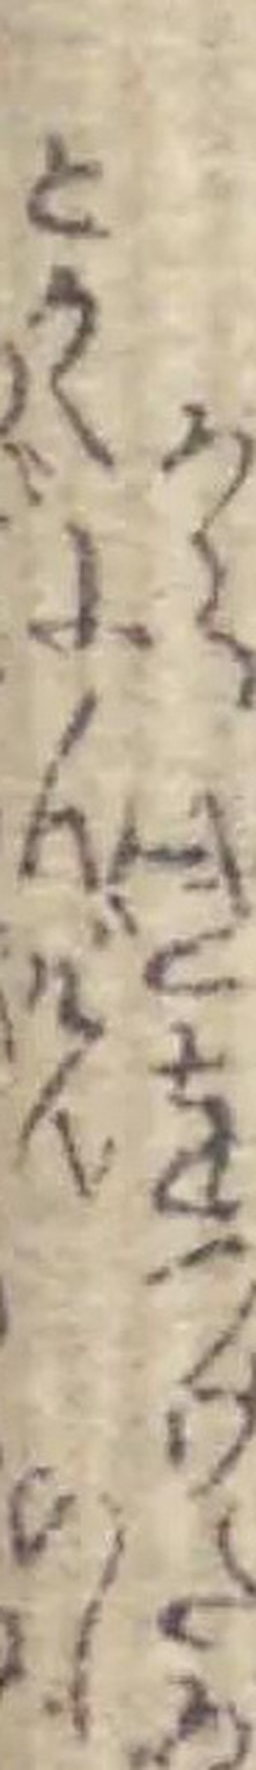とかくにんげん
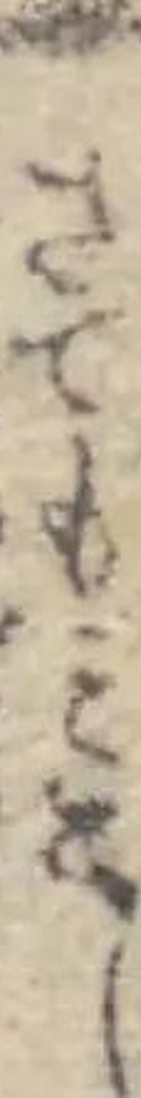さてもみこし
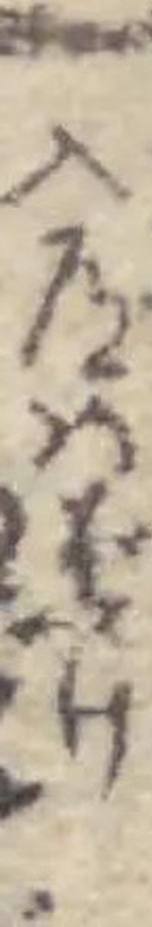入道はばけ
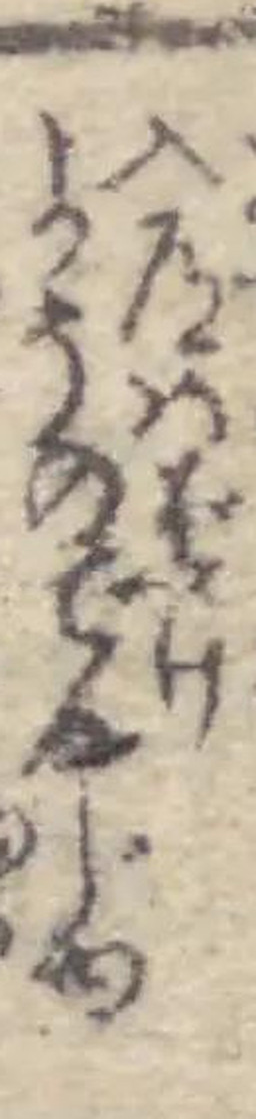ようのでんじゆ
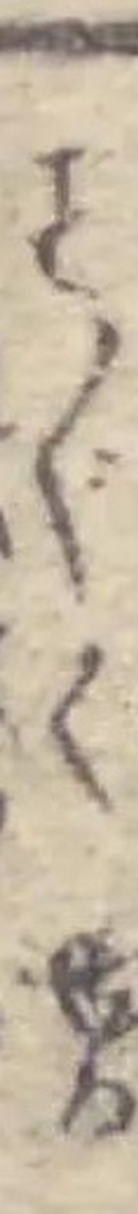こと〴〵くゆる
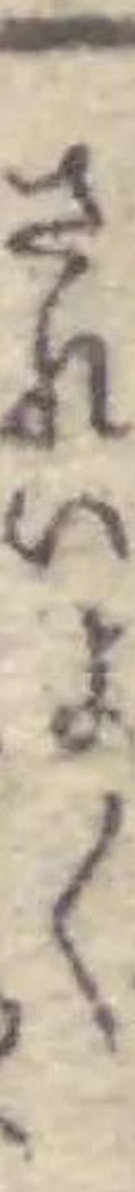されいよ〳〵
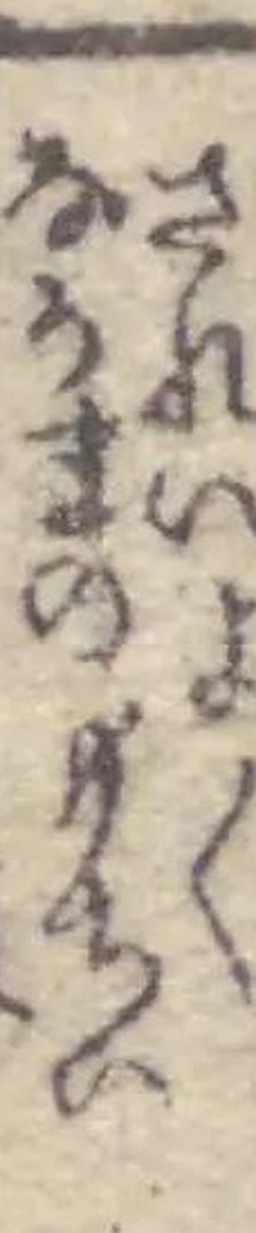なかまのもちい
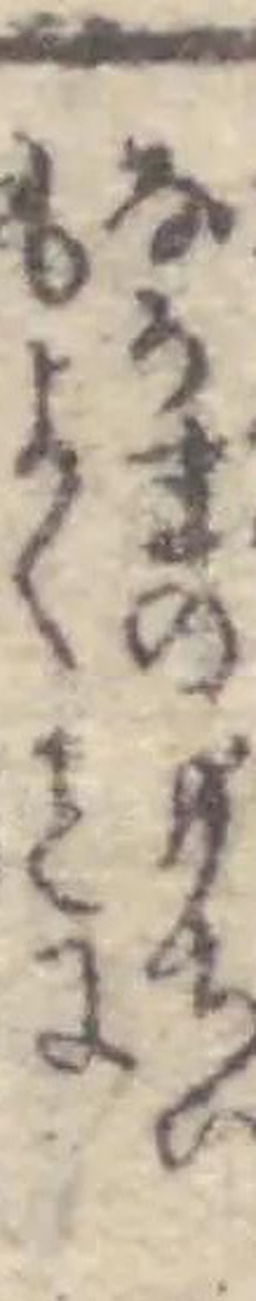もよくことに
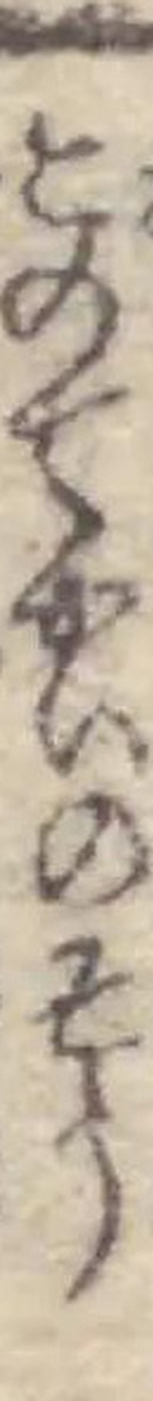このてやいのそう
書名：化物尽 4巻
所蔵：国立国会図書館 National Diet Library, JAPAN
